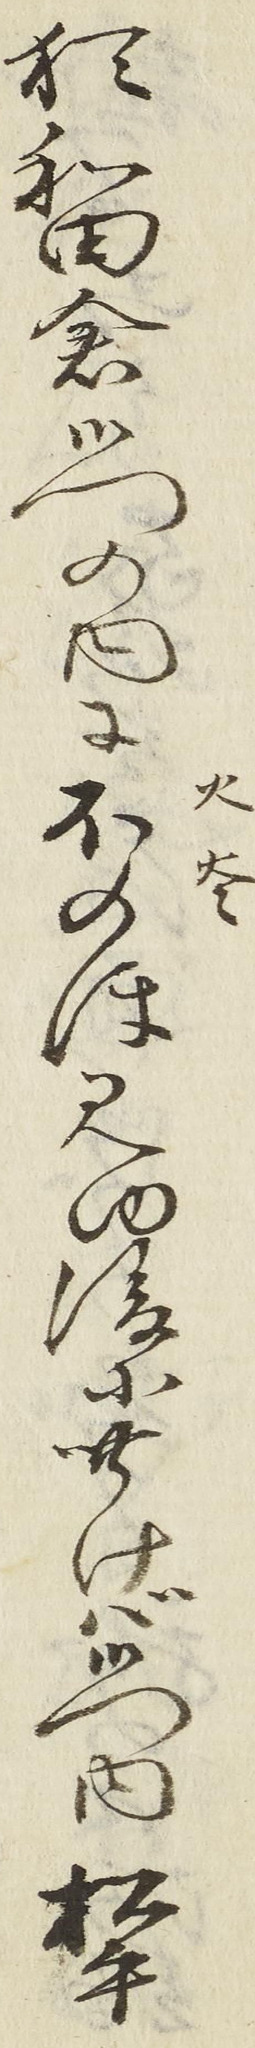猶和田倉御門の内にほの火炎ほ見ゆ後に聞けば御門内松平
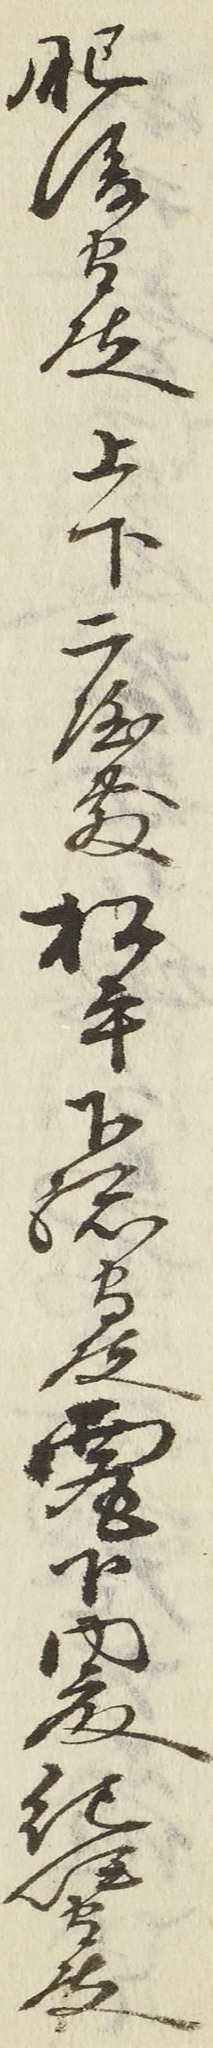肥後守殿上下二屋敷松平下総守殿西丸下内藤紀伊守殿
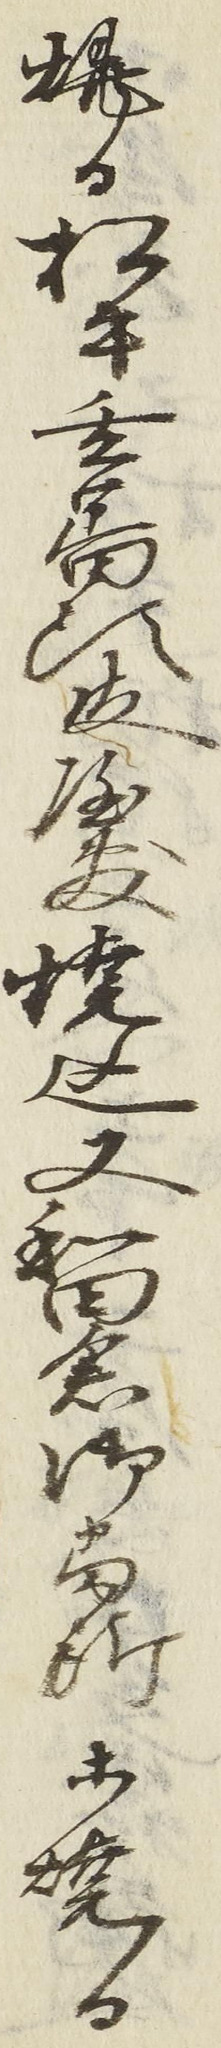焼る松平玄蓄頭殿屋敷焼込又和田倉御番所等焼る
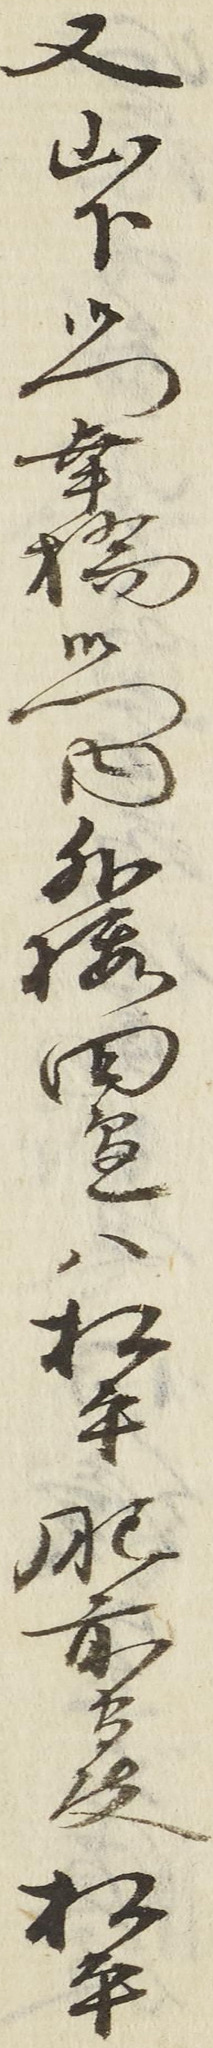又山下御門幸橋御門内外桜田辺は松平肥前守殿松平
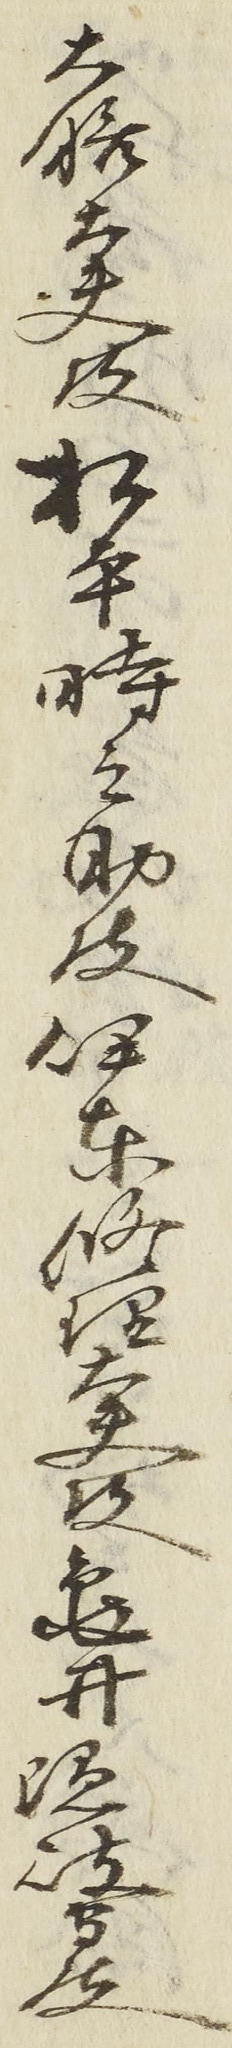大膳大夫殿松平時之助殿伊東修理大夫殿亀井隠岐守殿
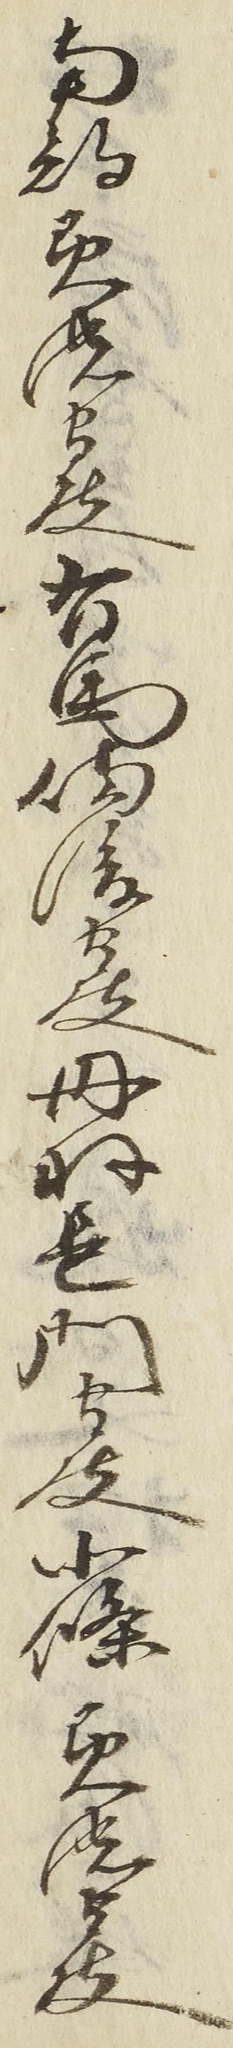南部美濃守殿有馬備後守殿丹羽長門守殿北條美濃守殿

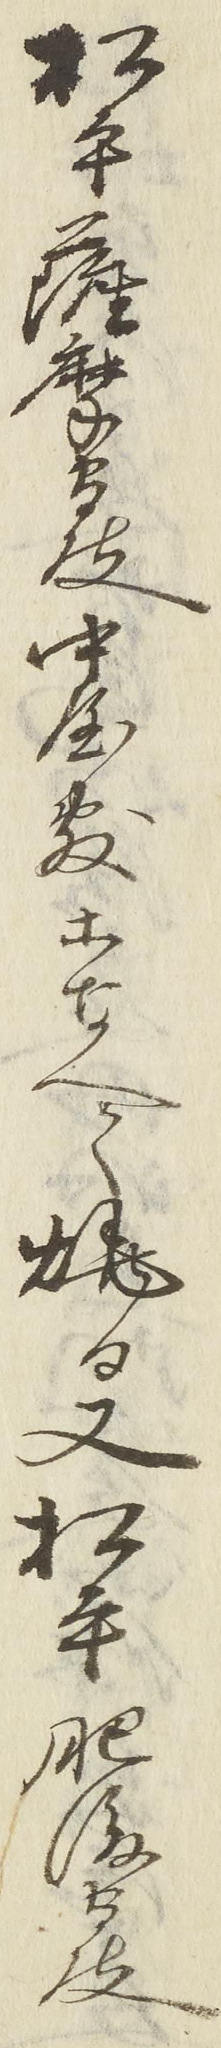松平薩摩守殿中屋敷等なへて焼る又松平肥後守殿
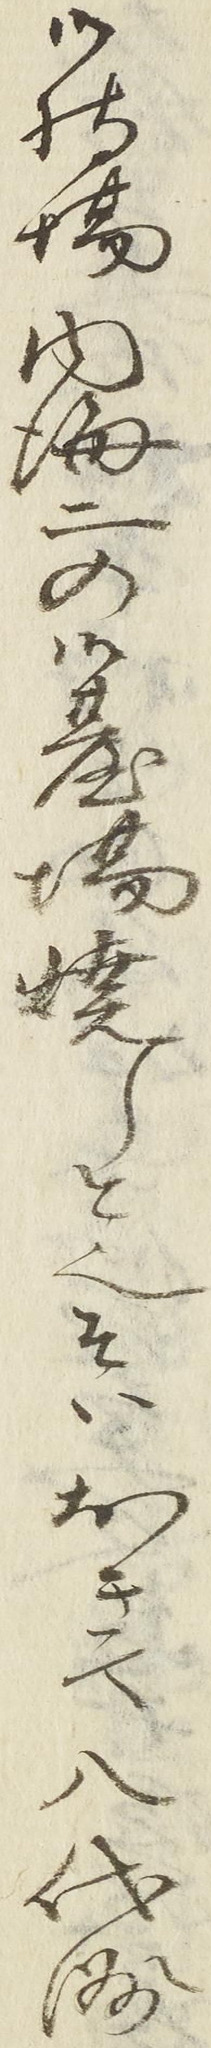御持場内海二の御台場焼しと也そはおきて八代洲
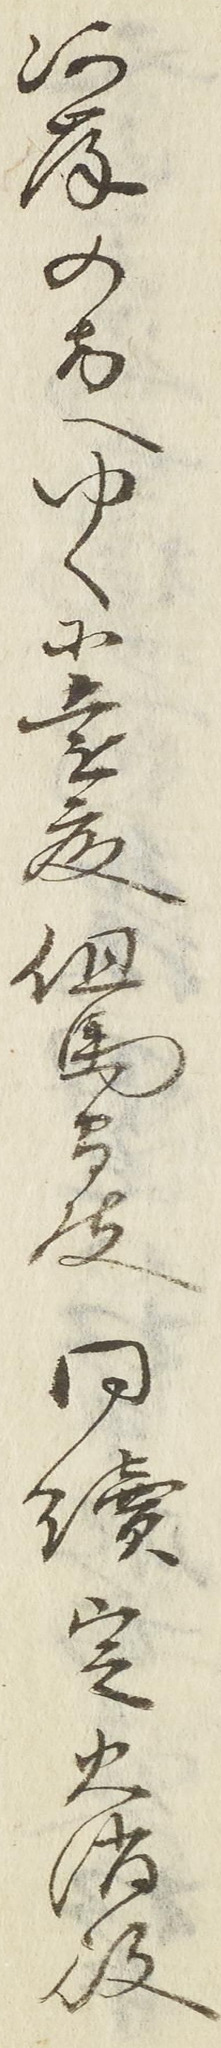河岸の方へゆくに遠藤但馬守殿同続常備消役
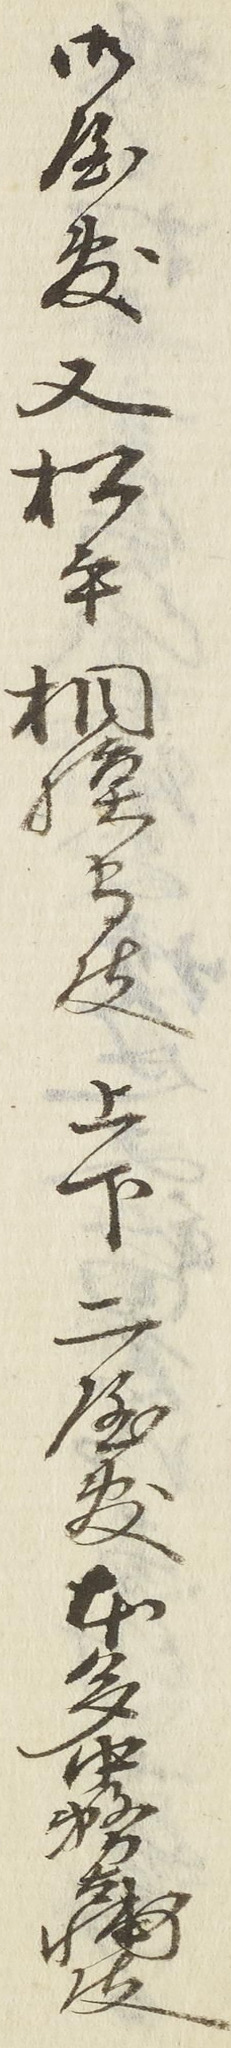御屋敷又松平相模守殿上下二屋敷本多中務大輔殿
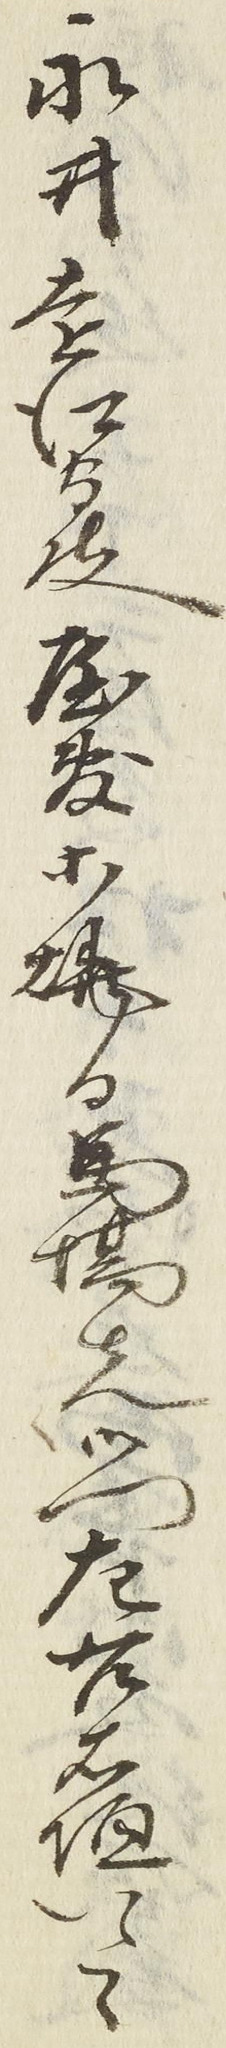永井遠江守殿屋敷等焼る馬場先御門左右石垣いたく
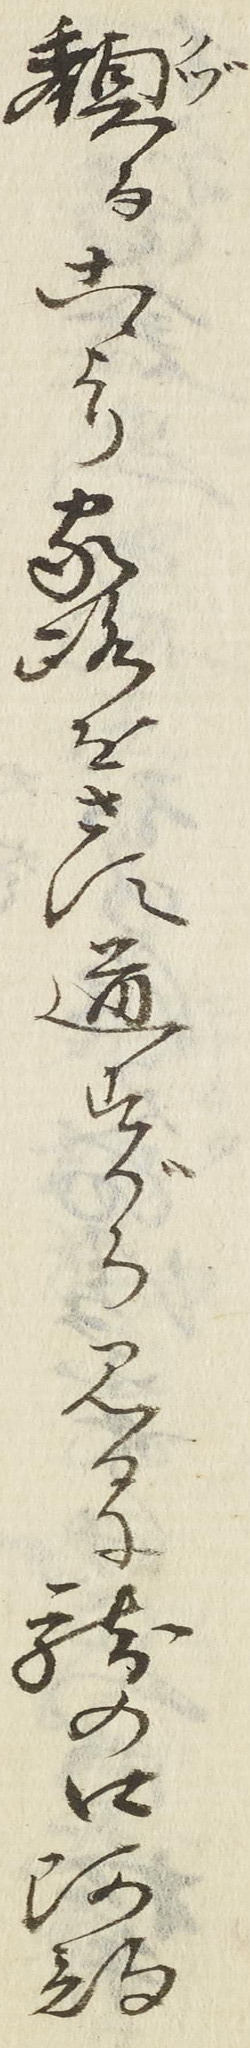頽るこゝより家路をさす道すがら見るに龍の口阿部
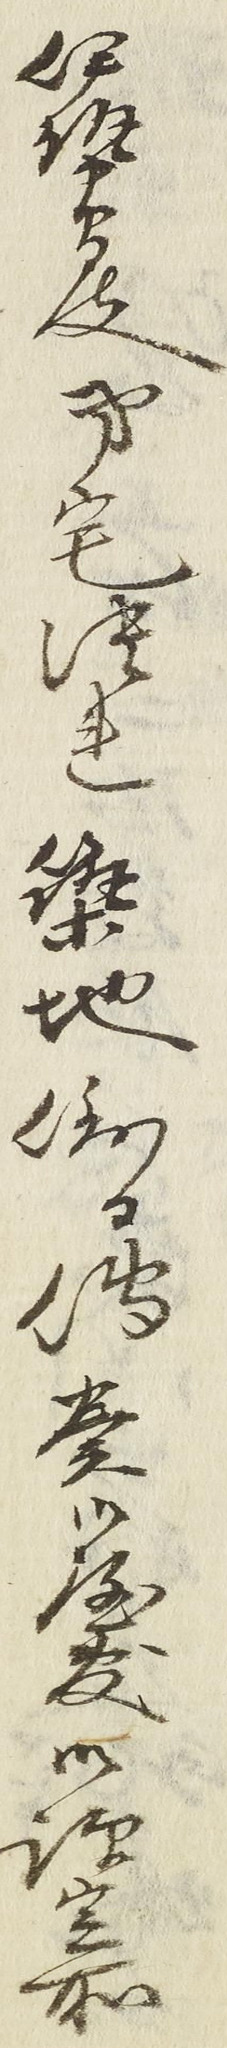伊勢守殿第宅潰れ築地倒る伝奏御屋敷御評定所
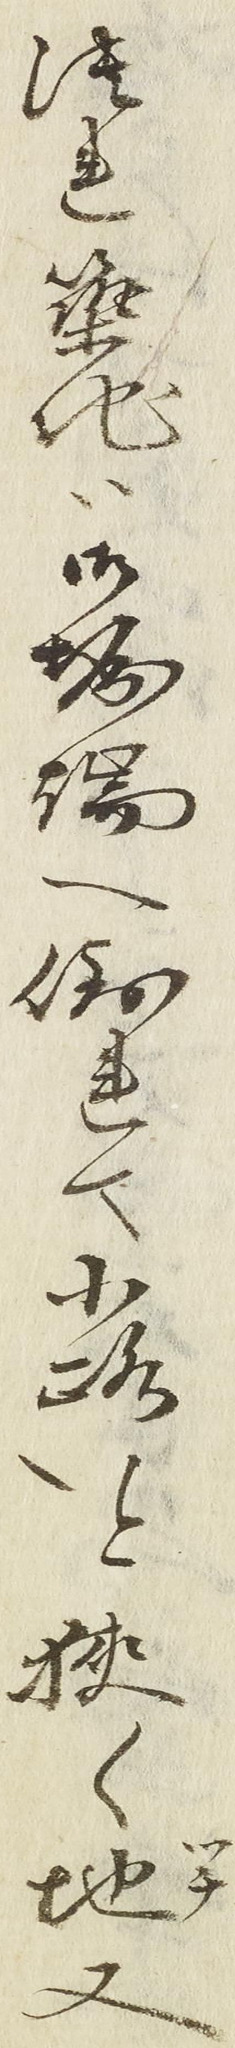潰れ築地は御堀端へ倒れて小路いと狭く地又
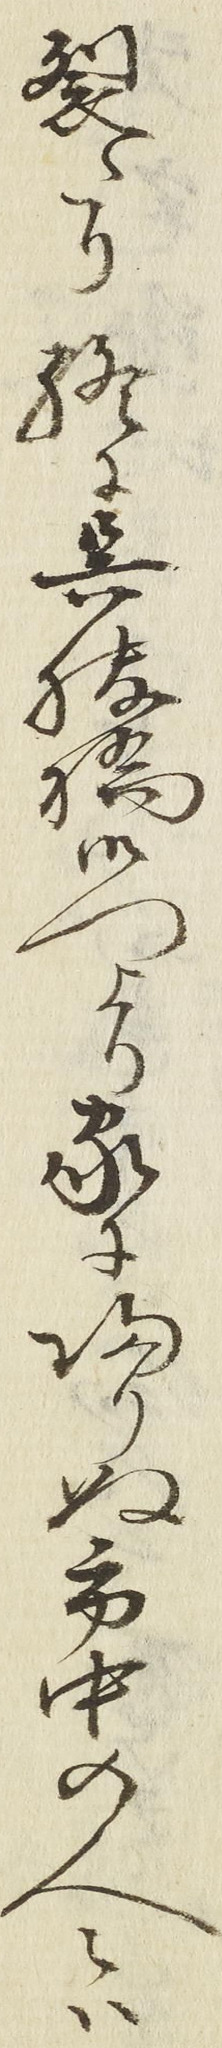裂たり終に呉服橋御門より家に帰りぬ市中の人〻は
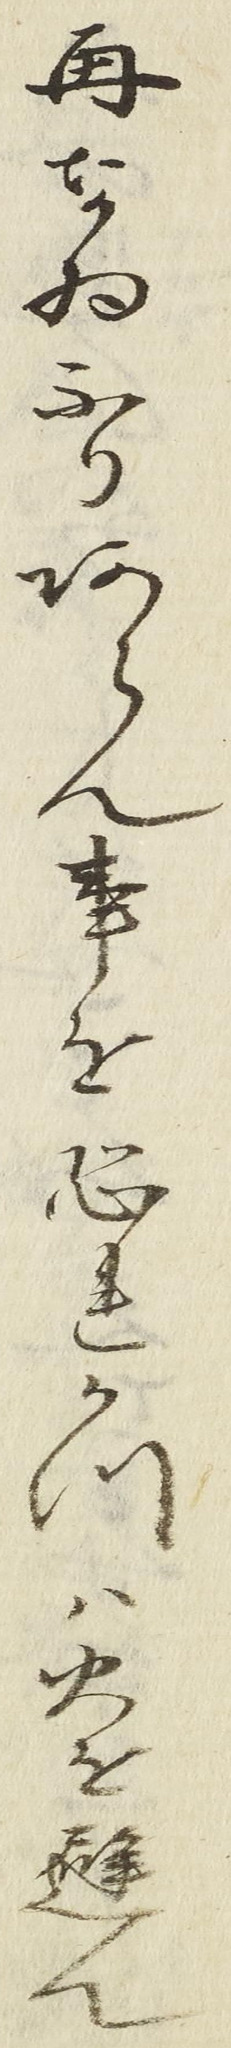再なゐふりあらん事を恐れかつは火を避ん
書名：やぶれ窓の記　全
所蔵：東京大学地震研究所図書室 Earthquake Research Institute Library, The University of Tokyo, JAPAN
